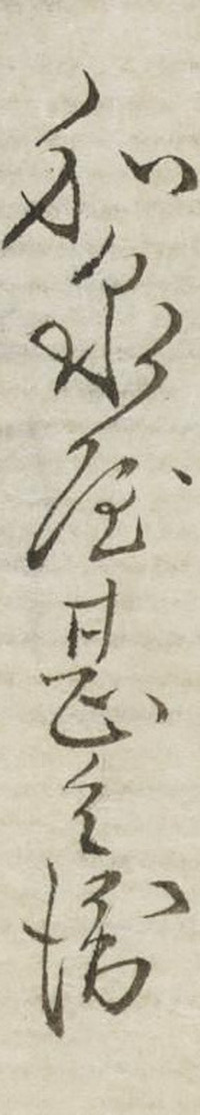和泉屋甚兵衛
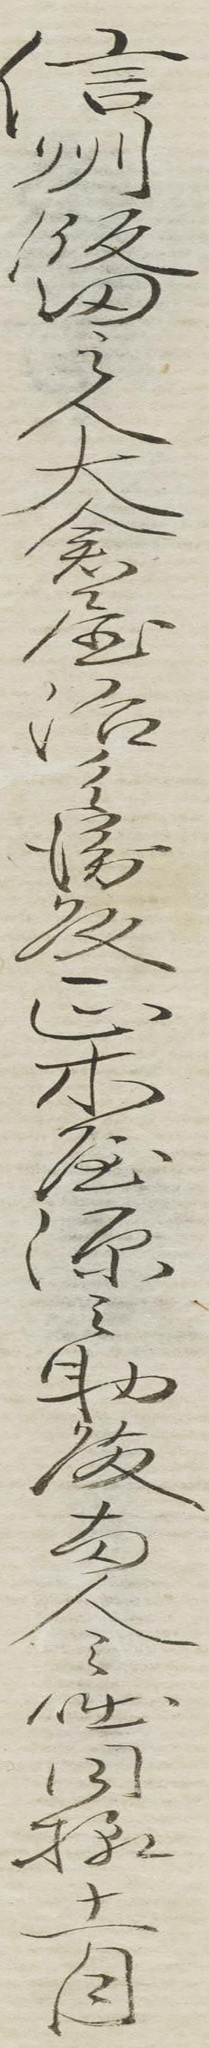信州飯田之人大倉屋治兵衛殿正木屋源之助殿両人之咄同様十一月
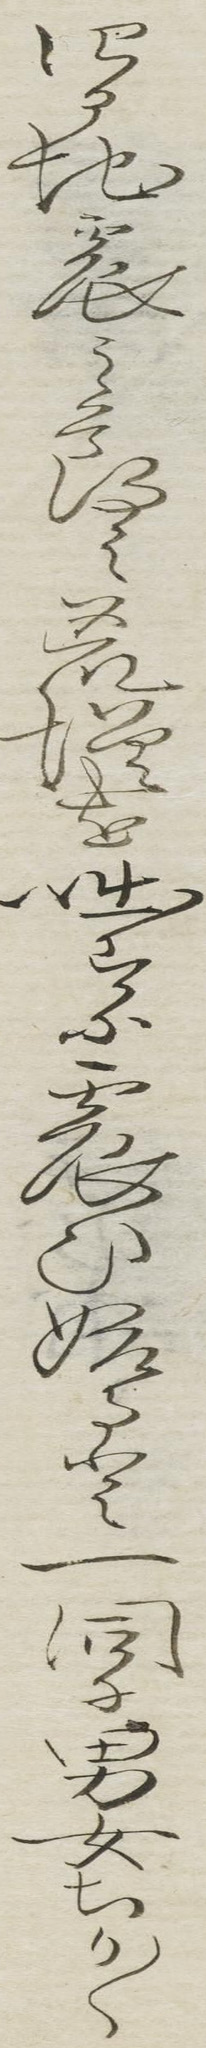四日地震之節之荒増を咄すに震ひ始ると一同に男女ちり〳〵
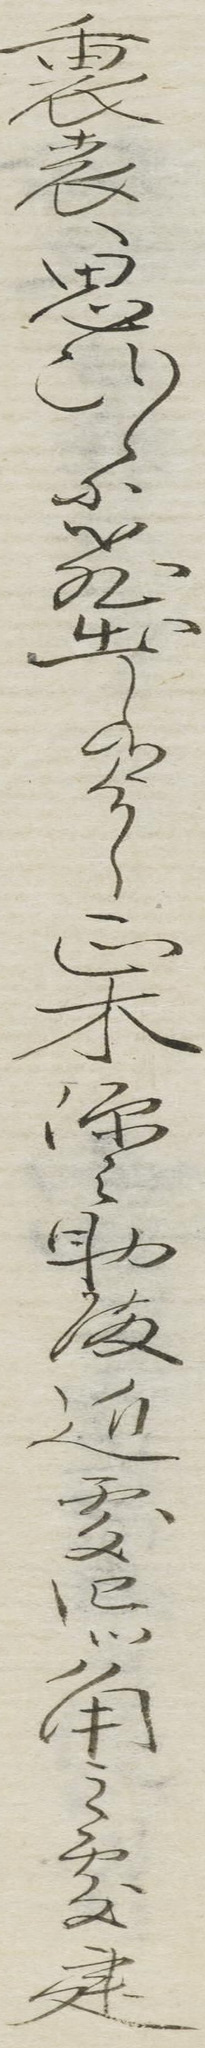裏表へ思ひ〳〵に飛出し候よし正木源之助殿近処四ツ角之処建
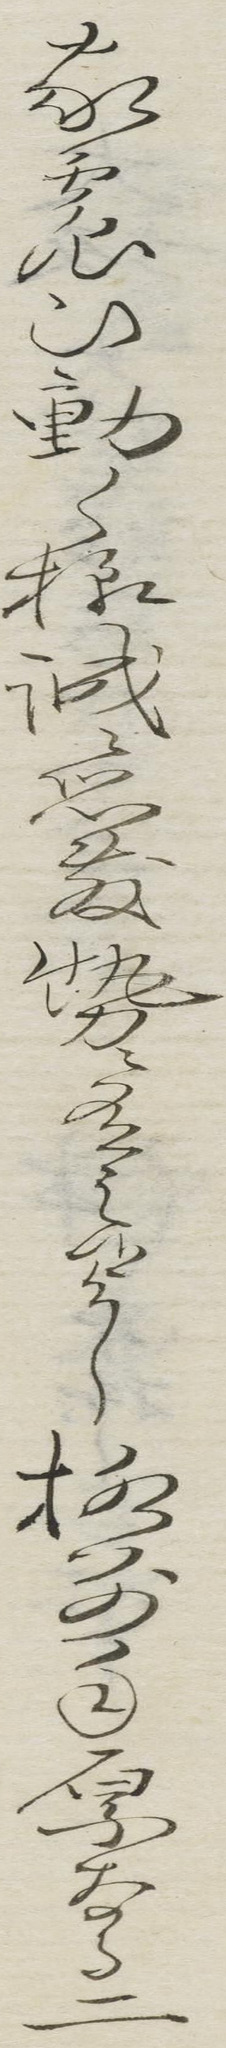家震ひ動く様誠ニ恐敷勢ニ有之候よし格別手厚なる二
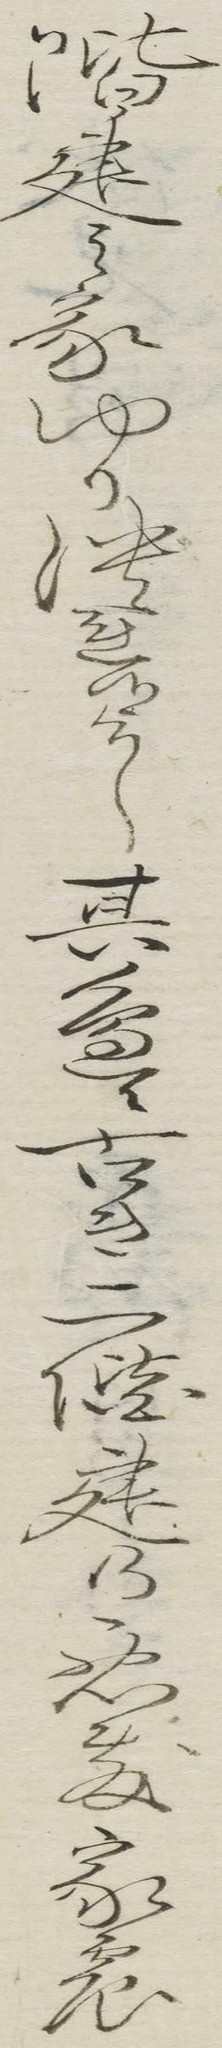階建之家ゆり潰れ候よし其辺ニ古き二階建の悪敷家震
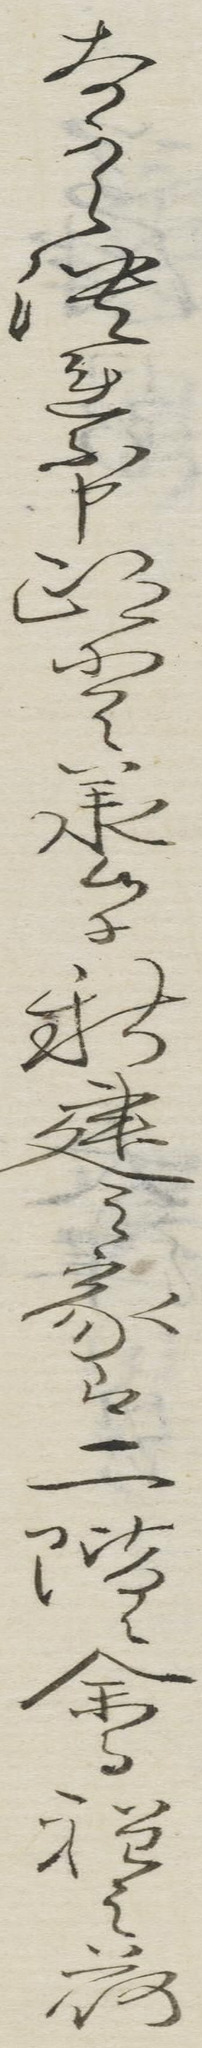なから潰れ不申跡にて承候に新建之家は二階ニ余る程之荷
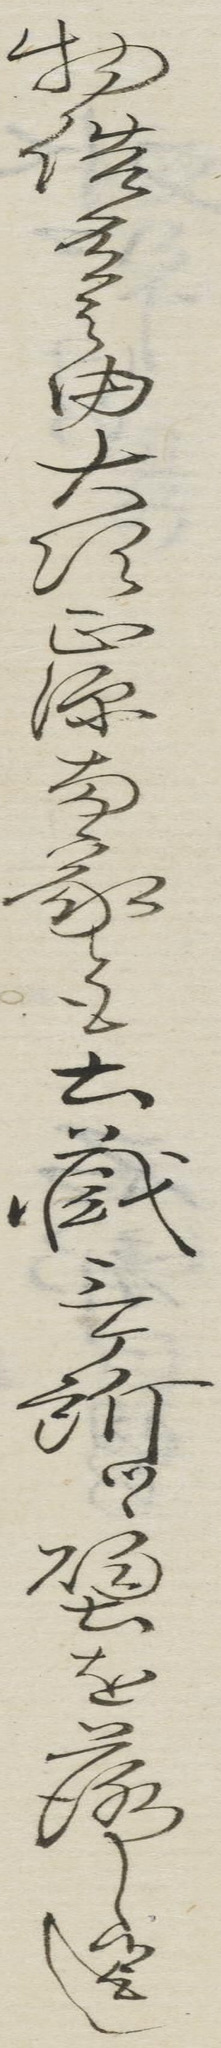物詰有之由大次正源両家とも土蔵三ケ所ツヽ壁を落し候よし
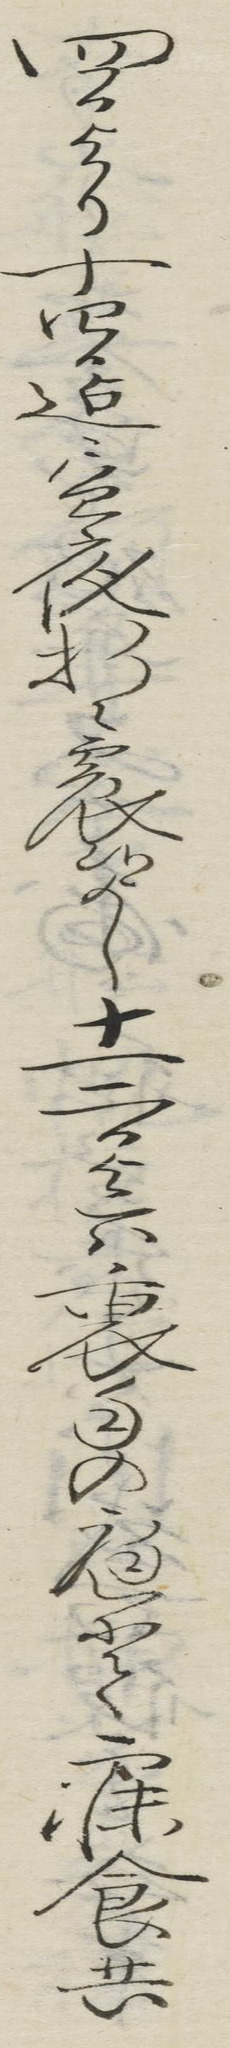四日より十四日迄昼夜折〻震候よし十一二日迄ハ裏手の庭にて寝食共
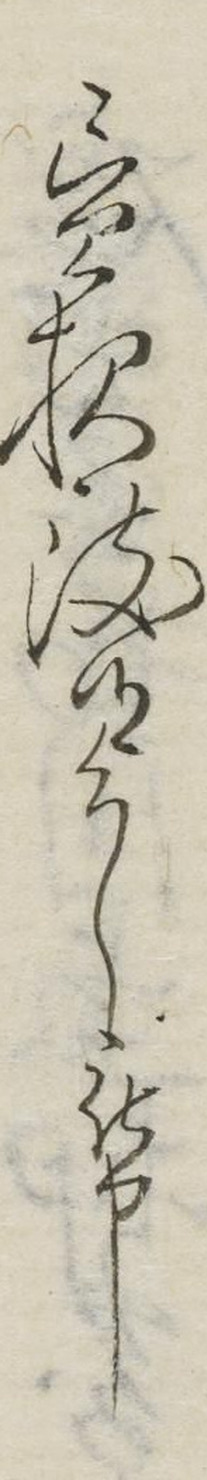昼夜致候よし被申
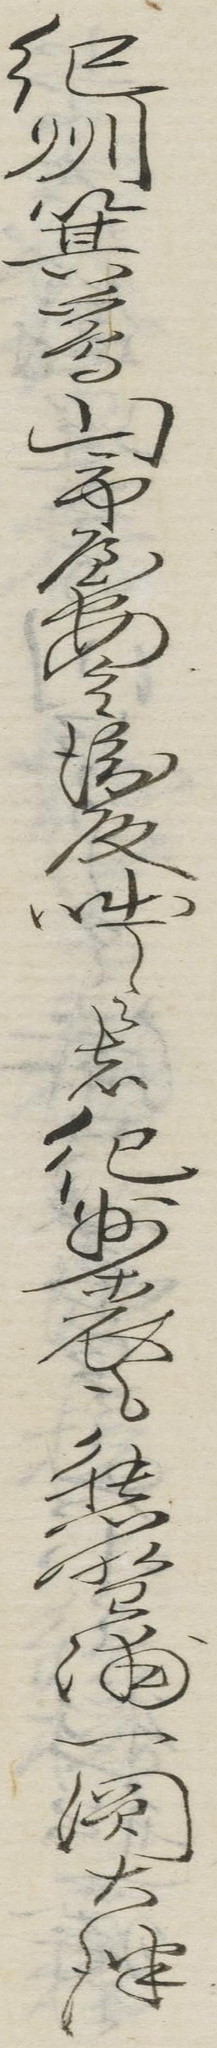紀州箕嶌山市屋安兵衛殿咄し候は紀州表も熊野浦一円大津
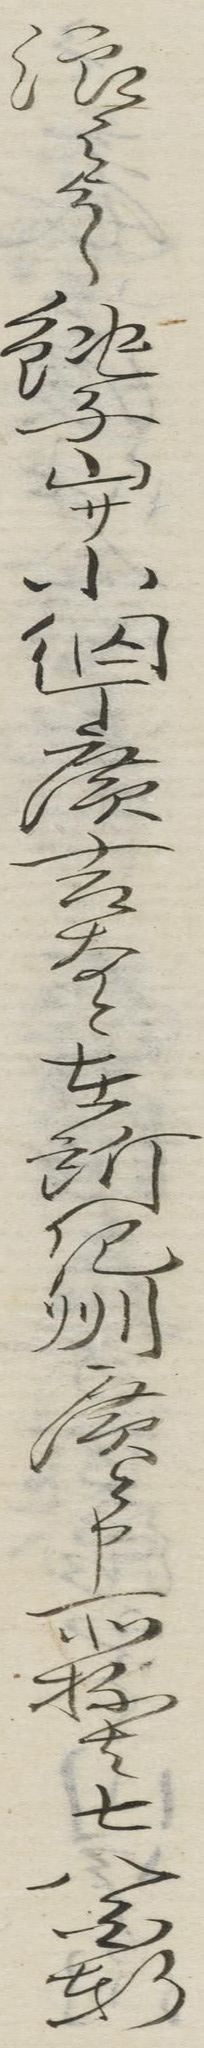浪之よし銚子山サ小網丁廣吉なと在所紀州廣と申所抔は七八百軒
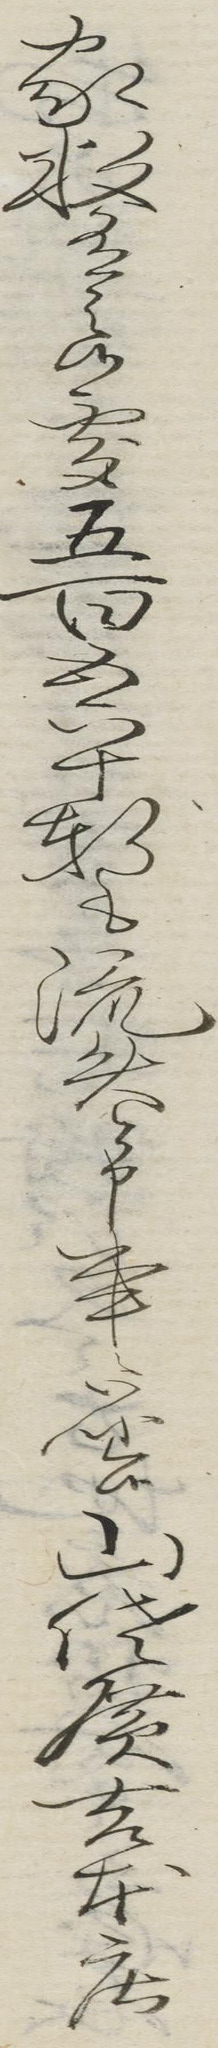家数有之候処五百五六十軒も流失と申事ニ御座候山佐廣吉本店
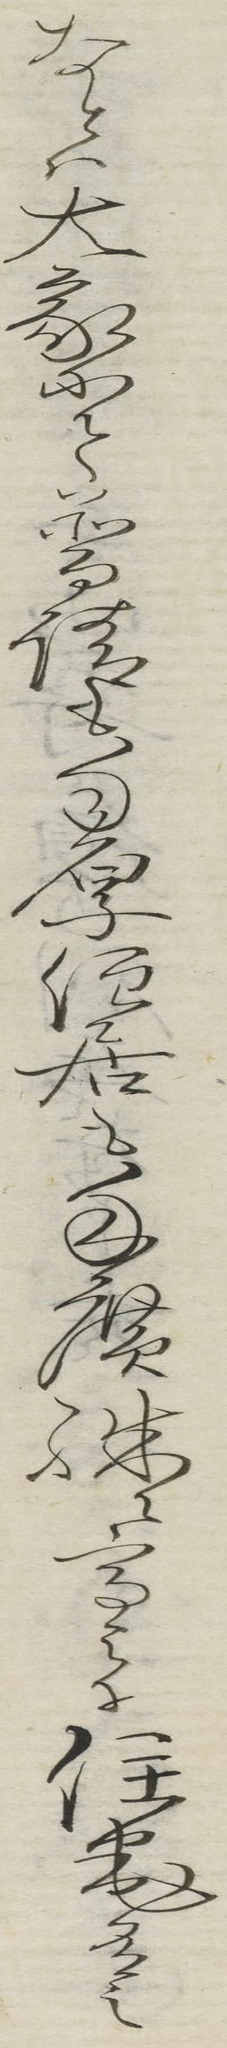なとハ大家にて普請も手厚住居も手廣殊ニ高ミに住宅有之
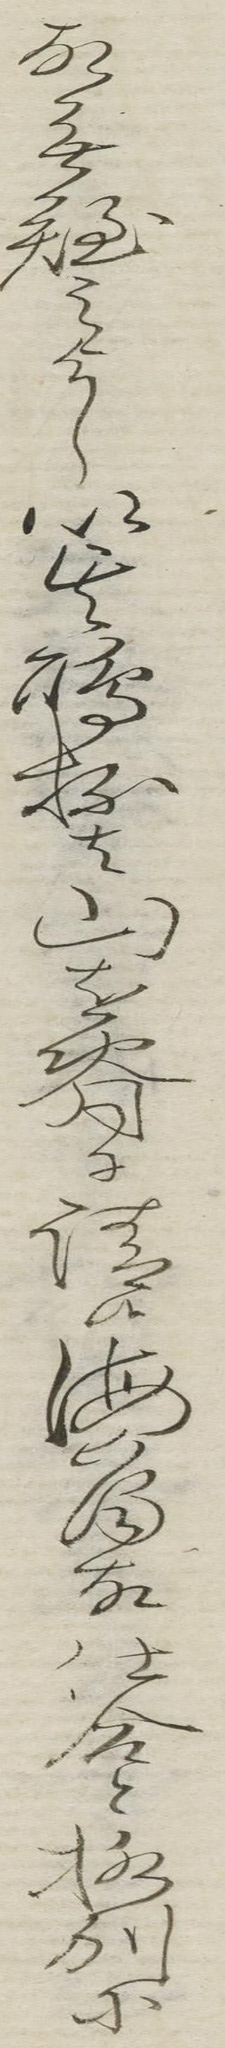故無難之よし箕嶋抔は山を背に請候海岸故仕合と格別に
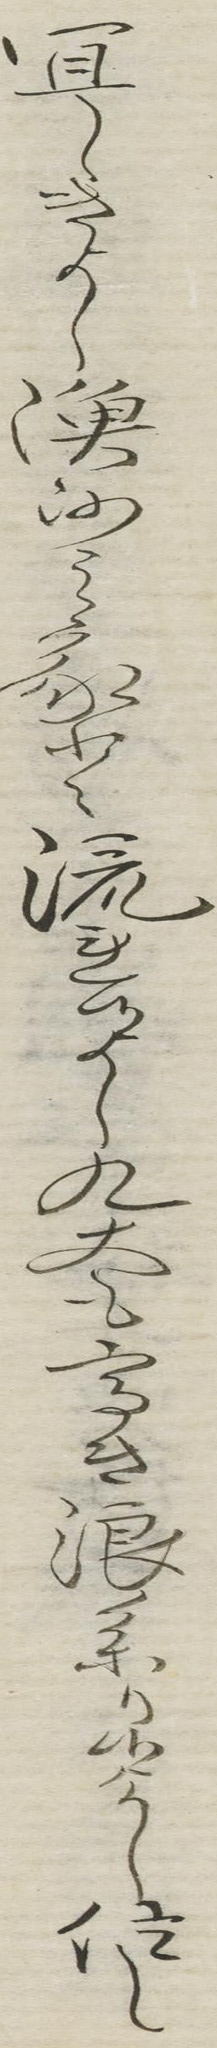宜しきよし漁師之家少〻流れ候よし九丈も高き浪参り候よし信し
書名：大地震實録
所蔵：東京大学地震研究所図書室 Earthquake Research Institute Library, The University of Tokyo, JAPAN
